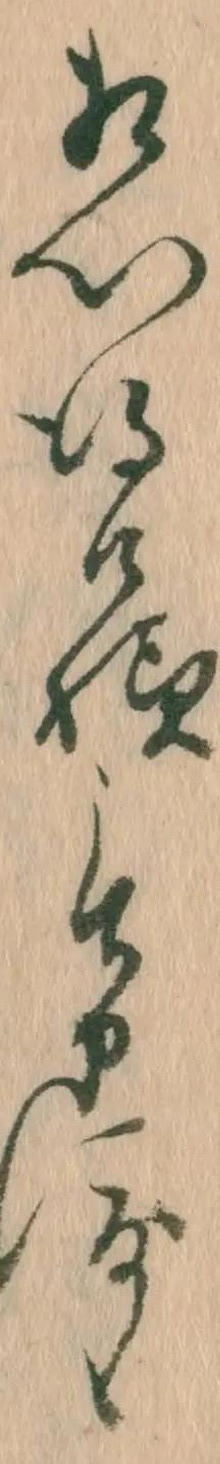相心得候様被申渡候
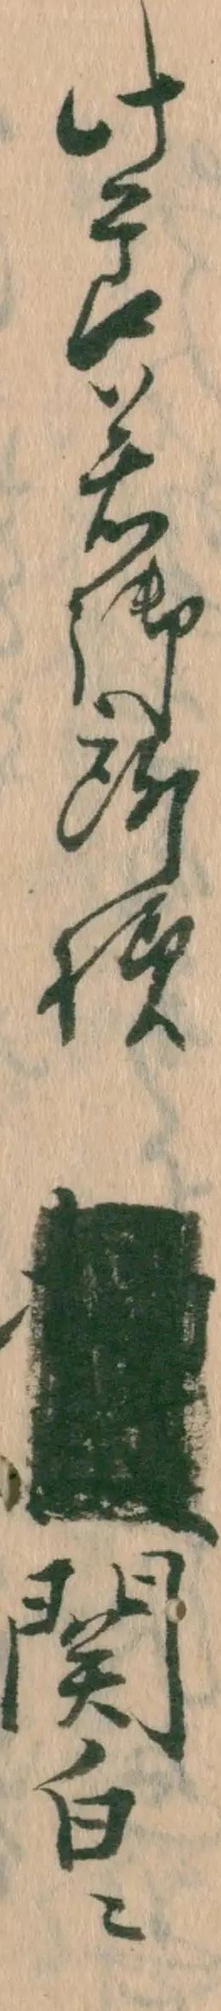此節若御所様関白ニ
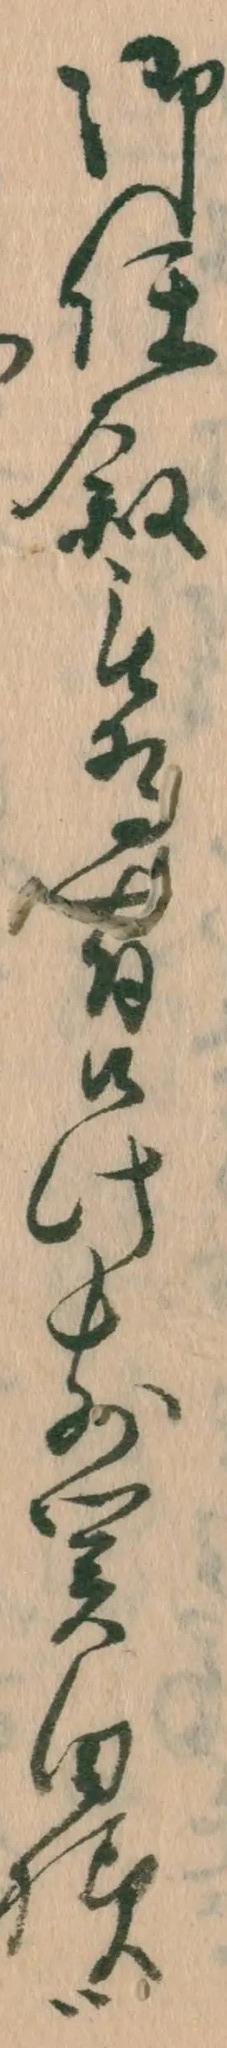御任叙被為有候此前関様ハ
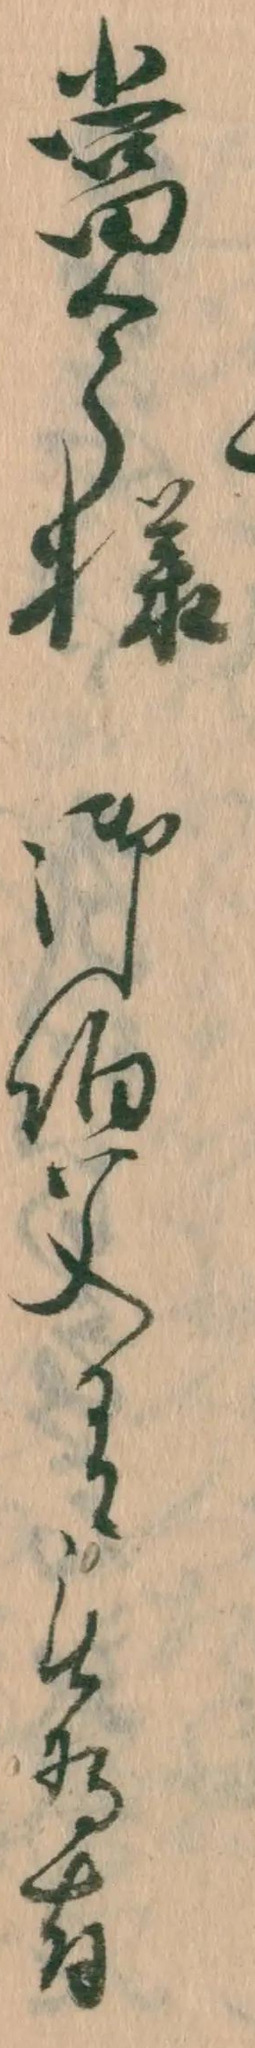當今様御伯父にて被為有
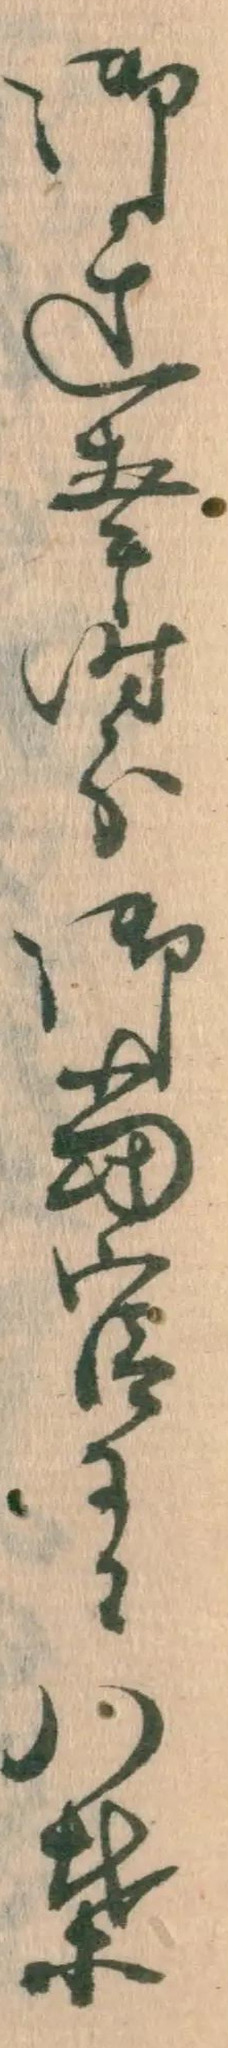御遷幸時分御当官にて八葉
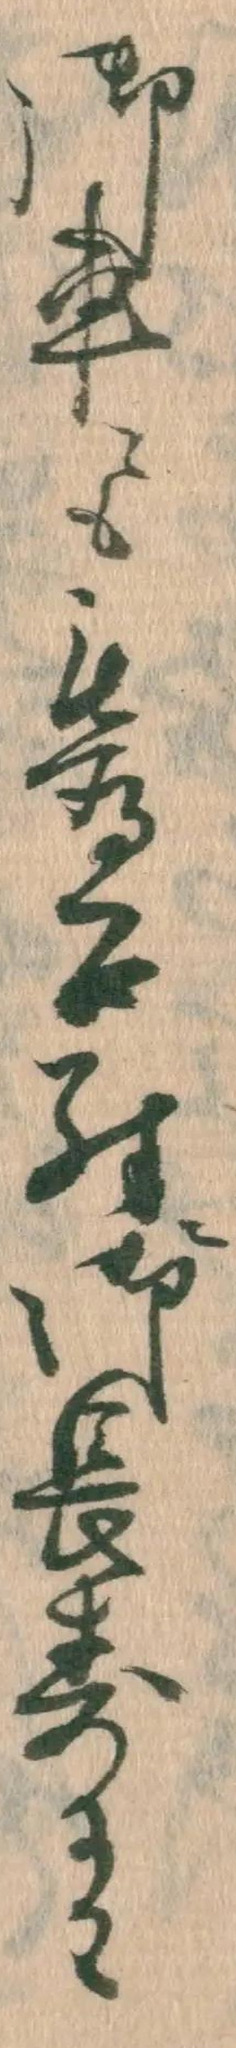御車ニも被為召殊ニ御長寿にて
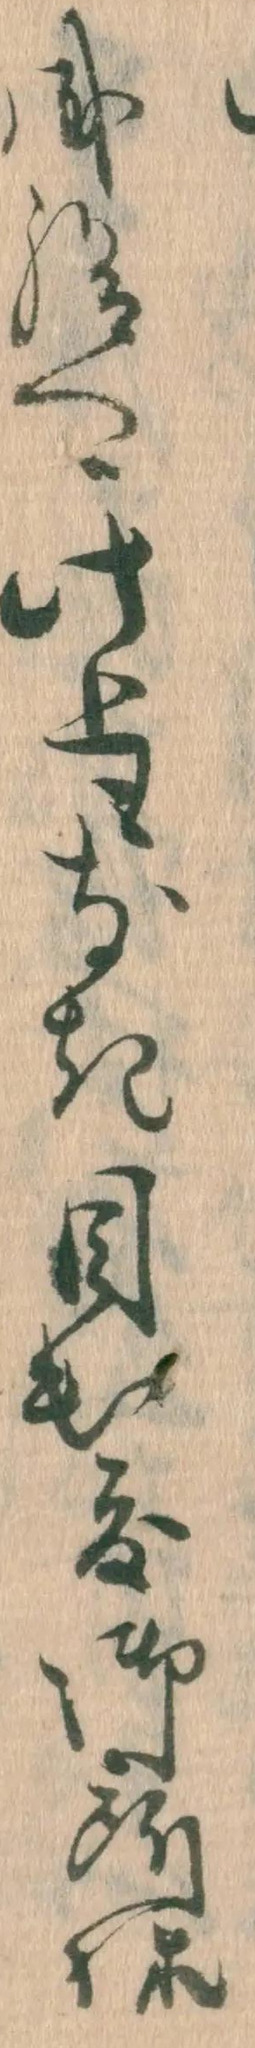成給へは此上もなき目出度御所様
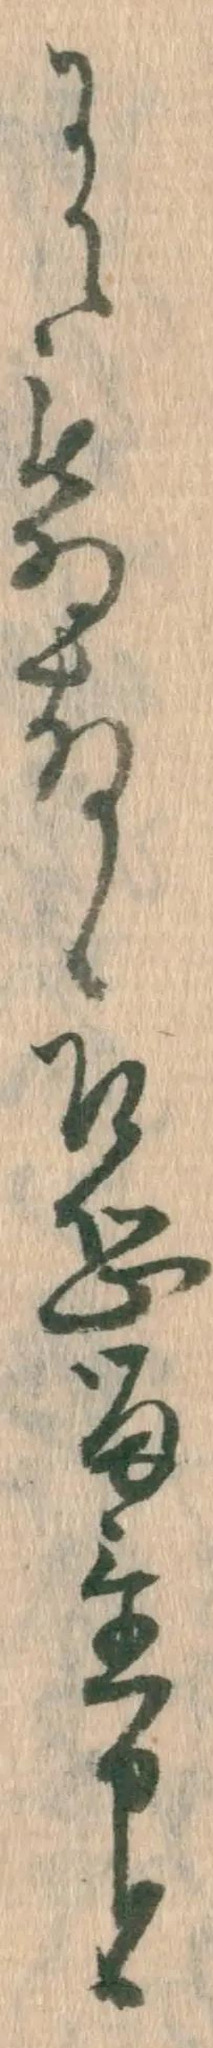にて被為存候乍恐留置申候
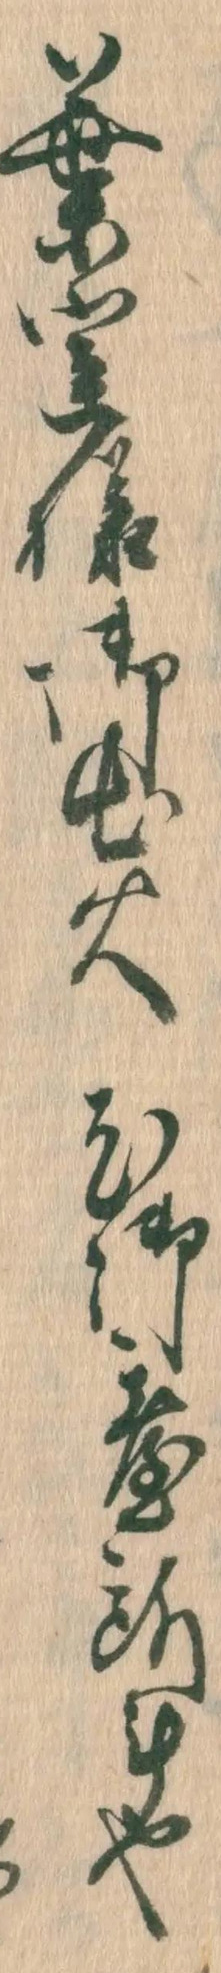子刻葉室様御出火尤御台所斗也
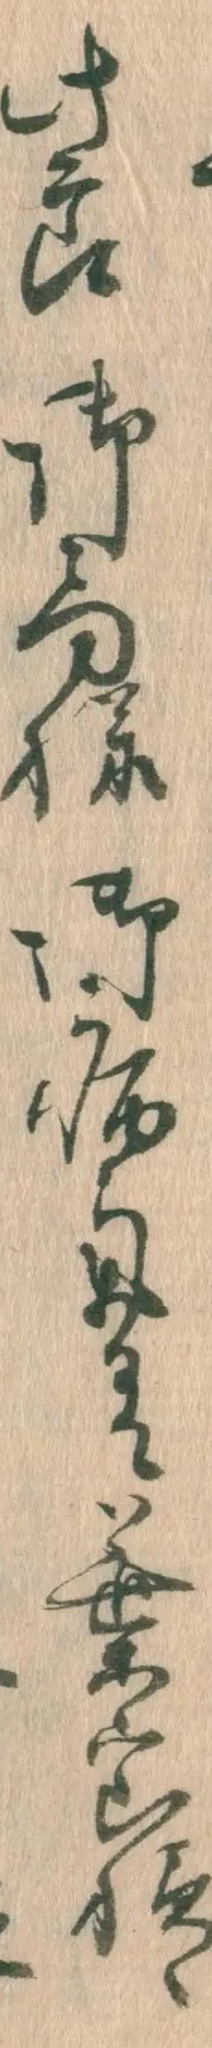此節御局様御病気にて葉室様へ
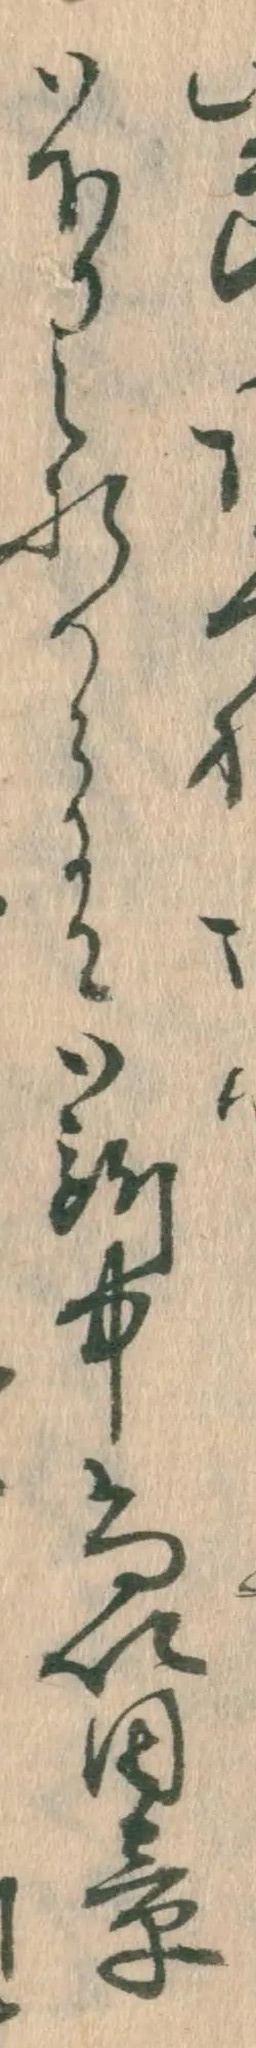御下り之折からにて御所中尚以周章

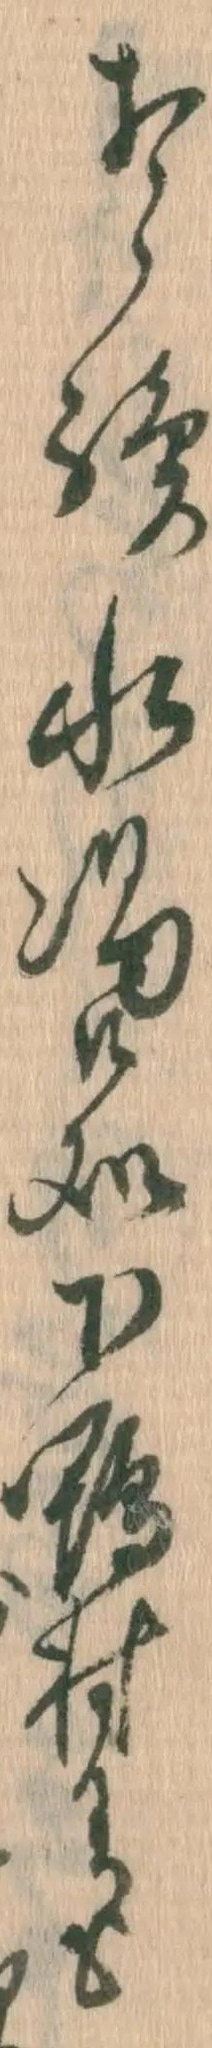打続水渇候処下鴨村にも
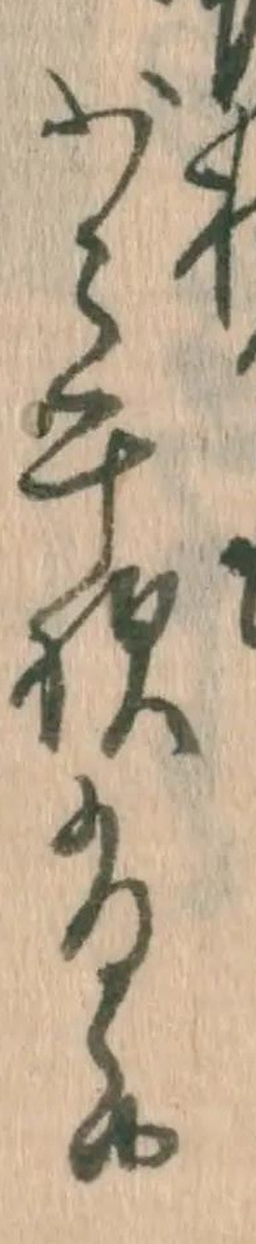少々干損有之候
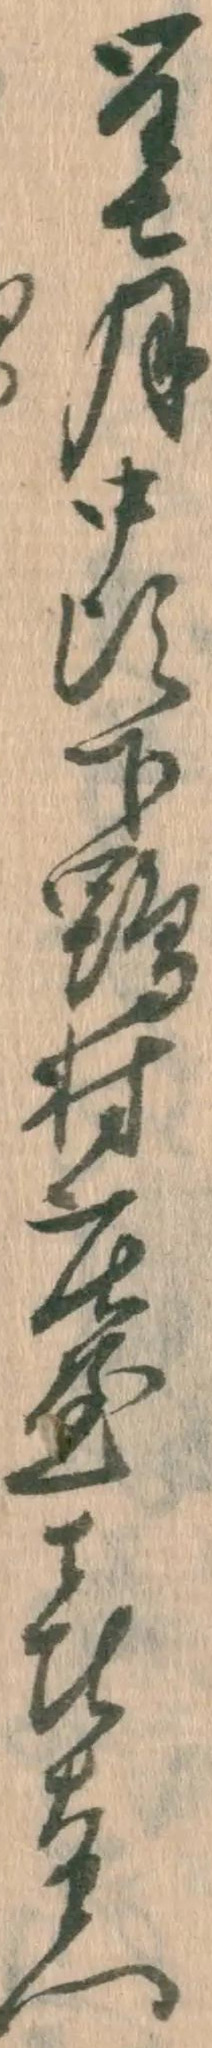閏七月中頃下鴨村庄屋喜右衛門
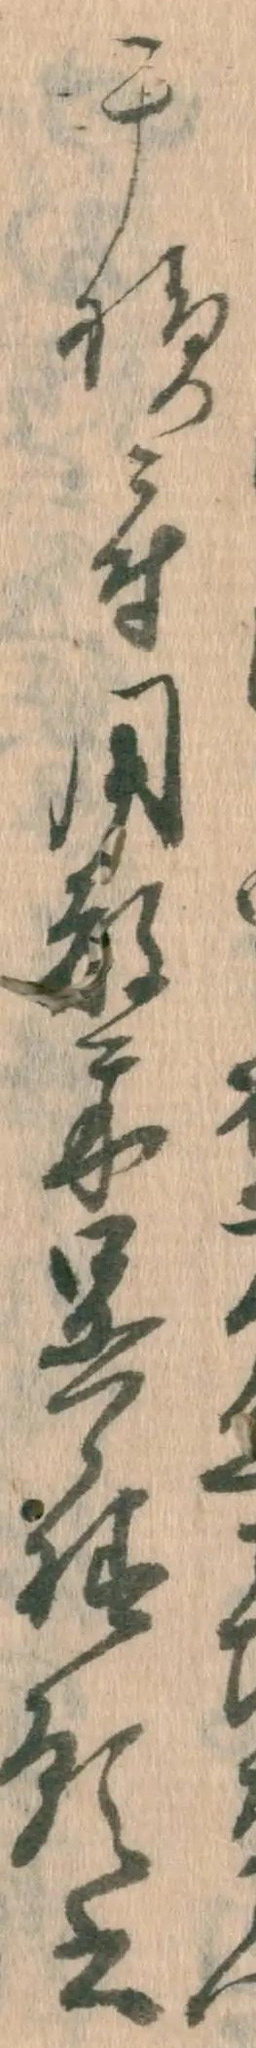干損ニ付用赦米呉候様願書
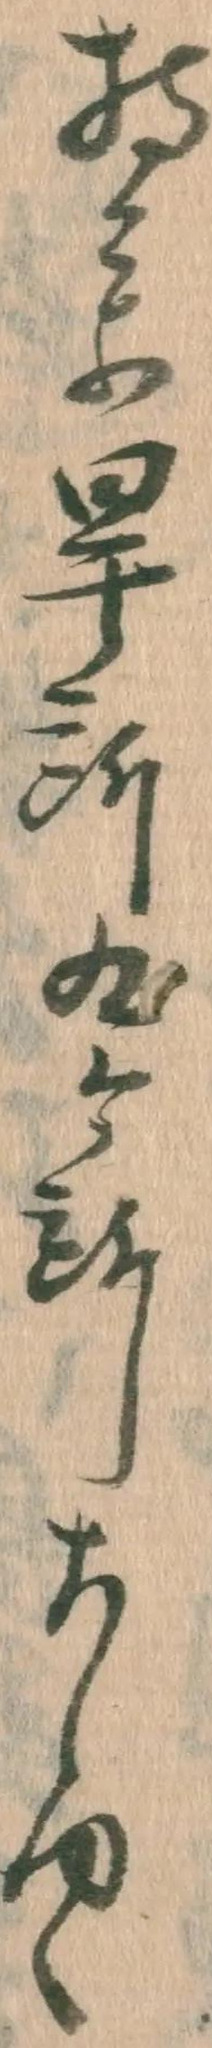持参旱所九ケ所右之内へ
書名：賀茂社記録. 第61冊
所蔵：国立国会図書館 National Diet Library, JAPAN
